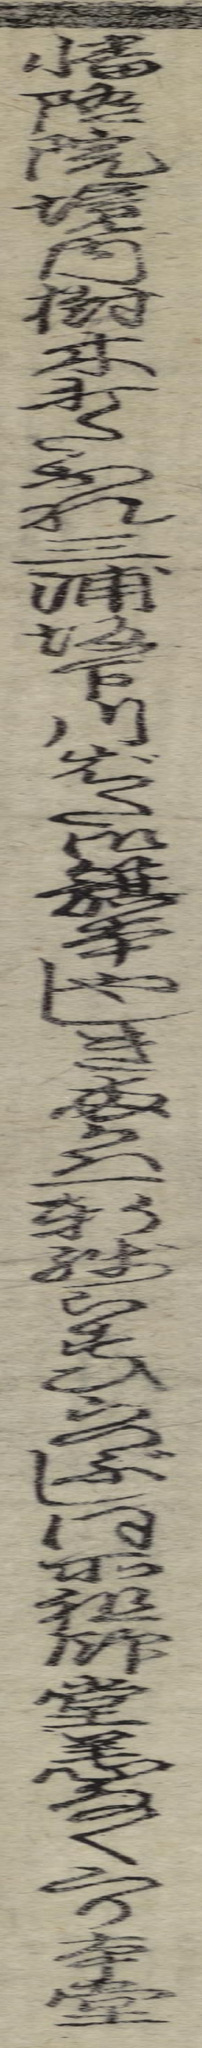幡随院境内樹木打たおれ三浦坂下川ばた御旗本やしき両かは一軒残らすひらつぶし同所祖師堂恙なくくり本堂
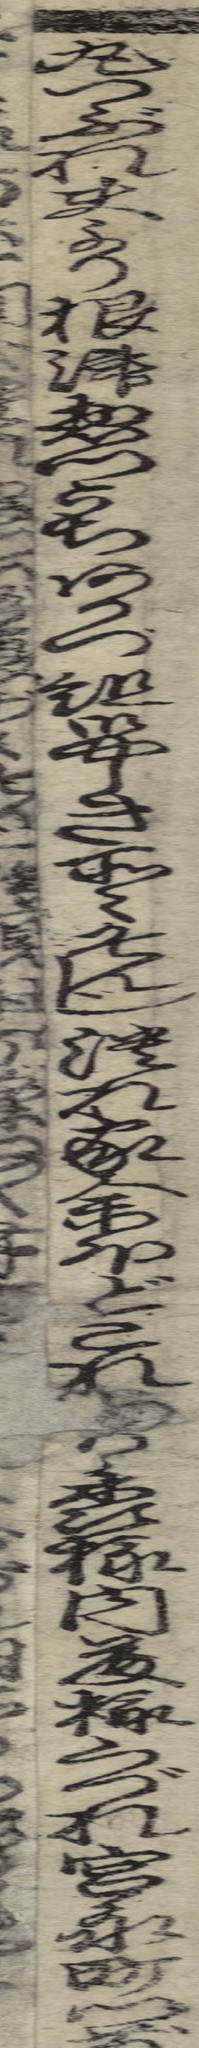丸つぶれ夫より根津惣門うちあかづ組御やしき所〻そんじ潰れ家余ほどこれあり森様内藤様くづれ宮永町門前丁
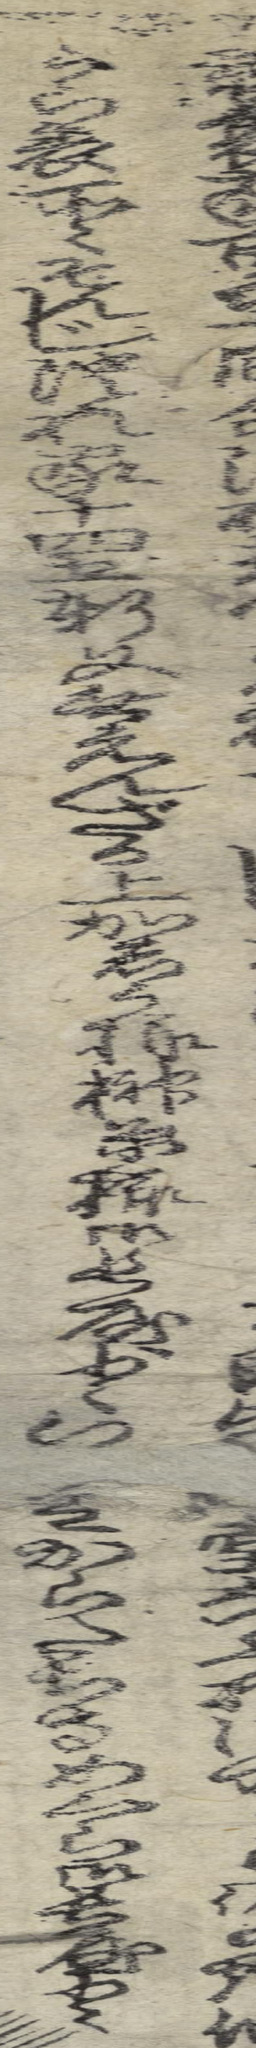うら表所〻そんじ潰れ家十四五軒又えんざか上加若う様榊原様御長屋少〻いたみからたち寺めくら御長屋少〻
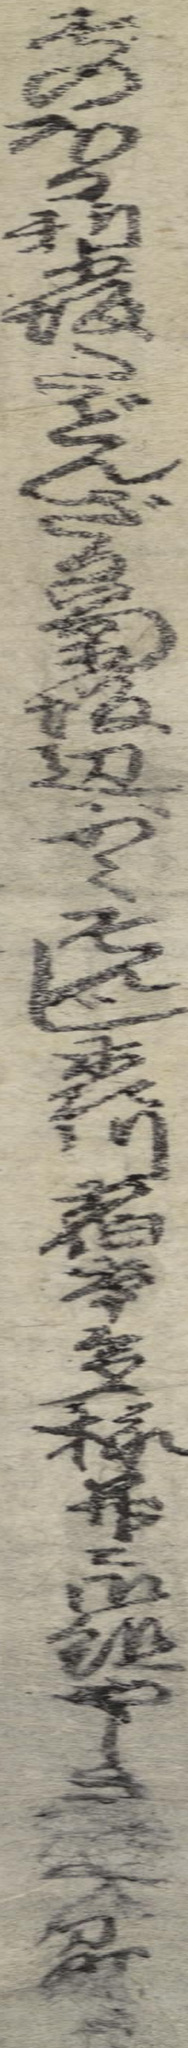そのほか利少坂たどんざか菊坂辺少〻そんじ森川宿本多様幷ニ御組やしき九軒屋敷町家其外
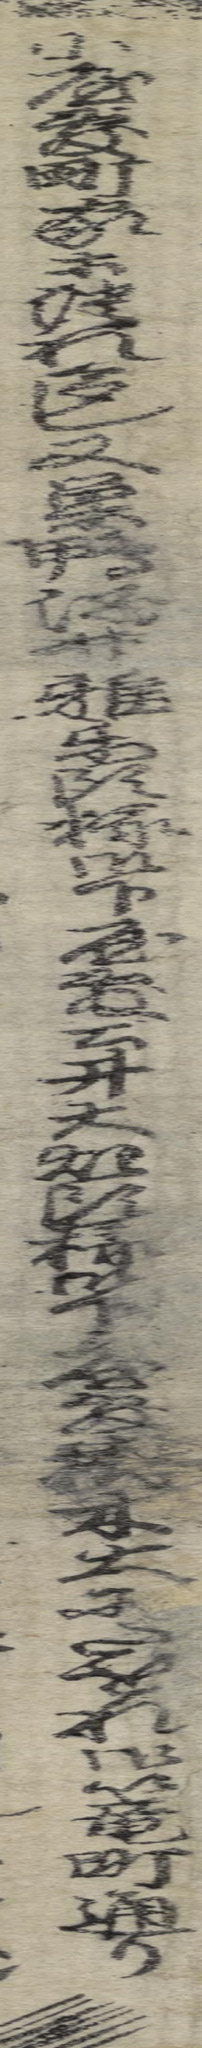小屋敷町家等潰れ多し又巣鴨酒井雅樂頭様御下屋敷土井大炊頭様御下屋敷杭木大たをれ御篭町通り
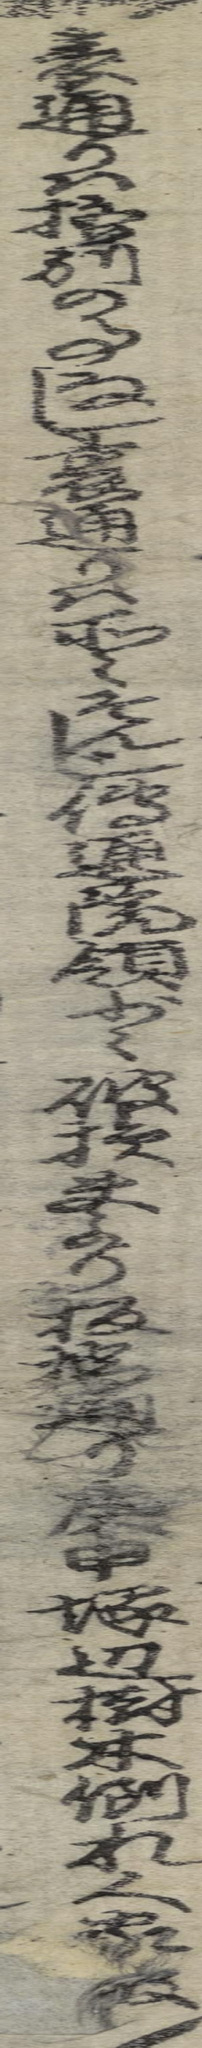表通りは格別の事なし裏通りは所〻そんじ伝通院領少〻破損夫より板橋通り庚申塚辺樹木倒れ人家破
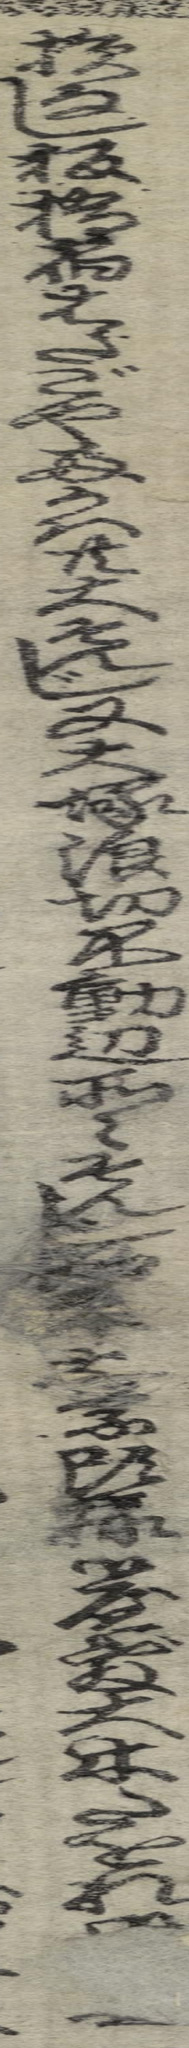損なし板橋宿はたご両かは共大そんじ大塚浪切不動辺所〻そんじ大学頭様御屋敷大木たをれ御屋敷
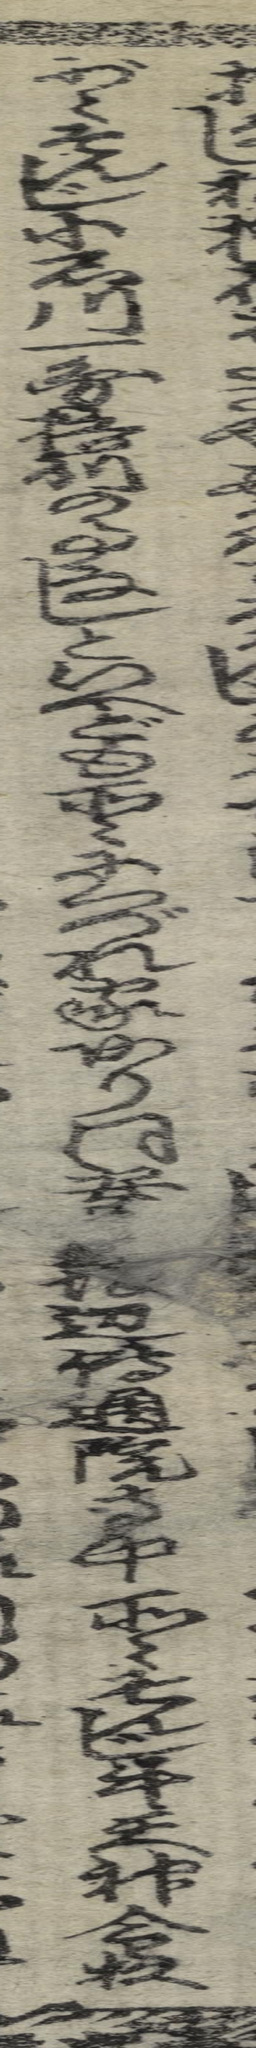少〻そんじ小石川一円格別の事なしといへども所〻にくづれ家あり同安坂？辺伝通院寺中所〻そんじ牛天神金杉
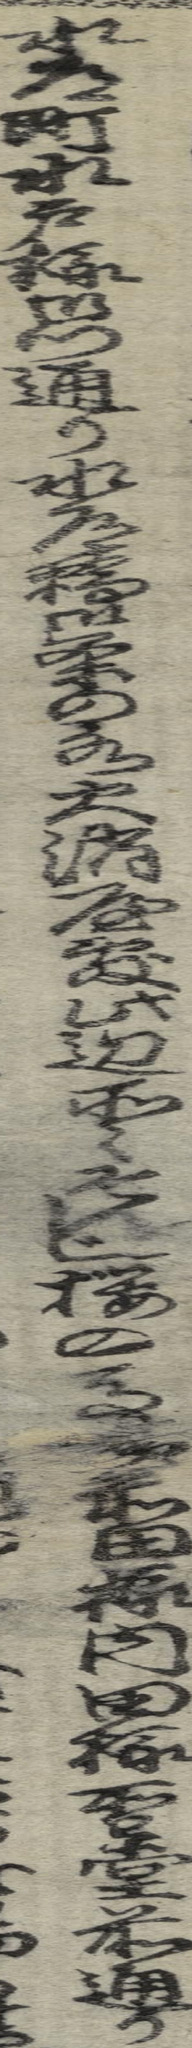水道町水戸様御門通り水道橋御茶の水火消屋敷此辺所〻そんじ桜の馬場？前田様内田様聖堂前通り
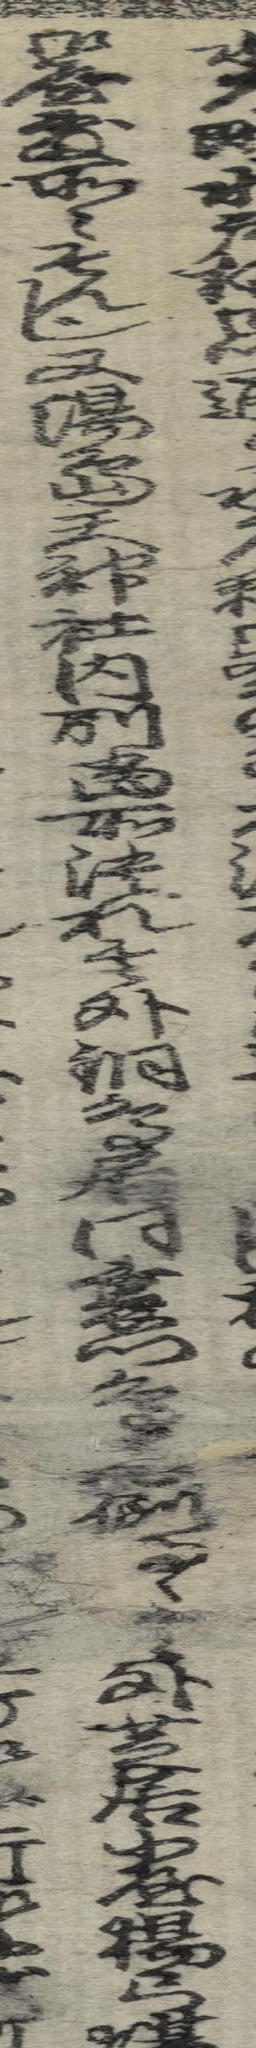御屋敷所〻そんじ又湯島天神社内別当所潰れ其外銅鳥居同裏門鳥居倒事其外芝居小屋揚弓場
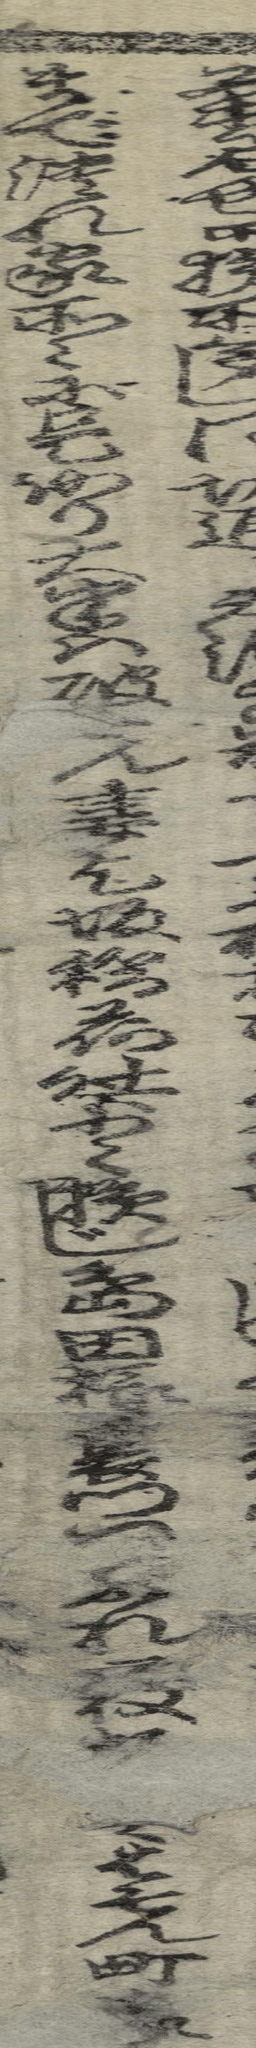まで潰れ家所〻に是あり大半は破そん妻乞坂稲荷社少〻損じ島田様御長門はつぶれはそん町へ
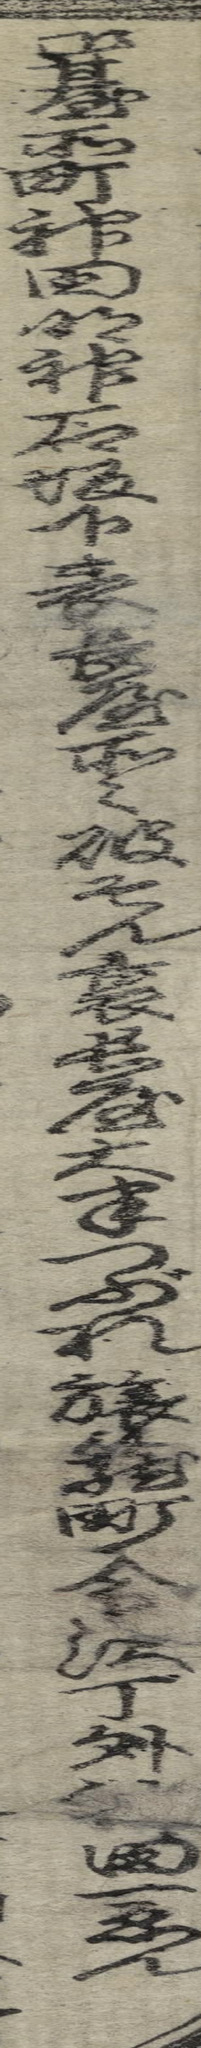御台所町神田明神石坂下表長屋所〻破そん裏長屋大半つぶれ旅籠町金沢丁外神田一ゑん
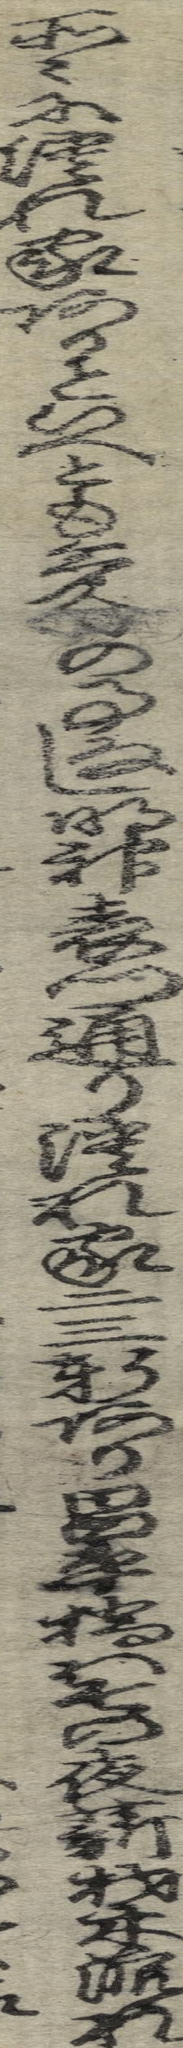所〻に潰れ家ありといへとも多分の事なし明神表門通り潰れ家二三軒あり昌平橋はその夜薪材木流れ
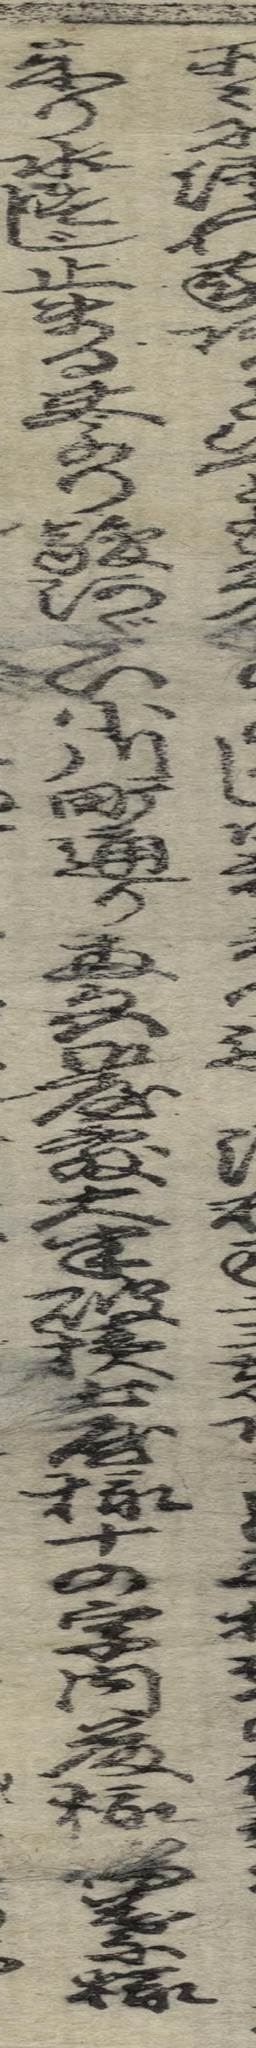来り水すじ止まる夫より駿河だい小川町通り両かは御屋敷大半破損土屋様十の宗内藤様稲葉様
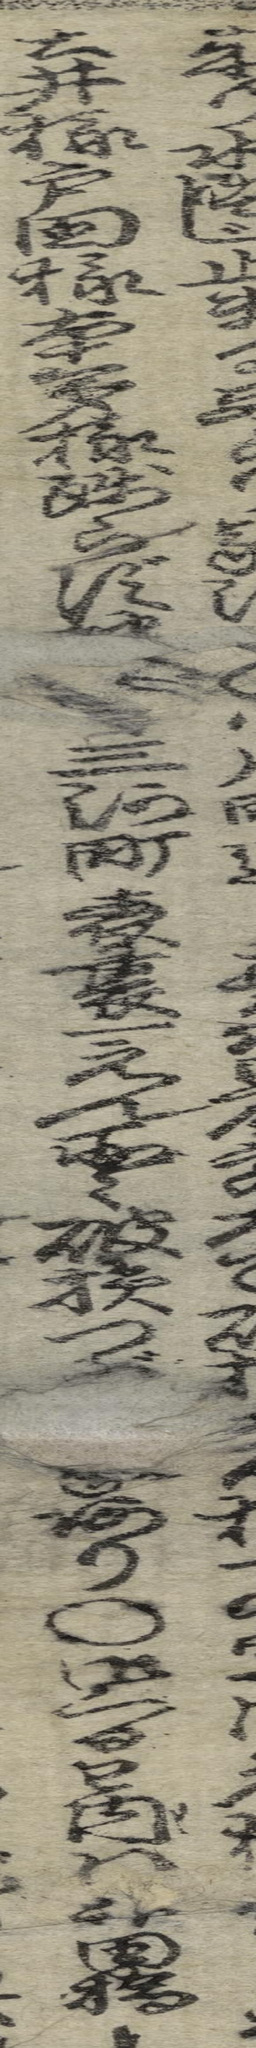土井様戸田様本郷様残らず潰れ三河町表裏一えん所〻破損つぶれ家あり〇御くるわ内は神田橋
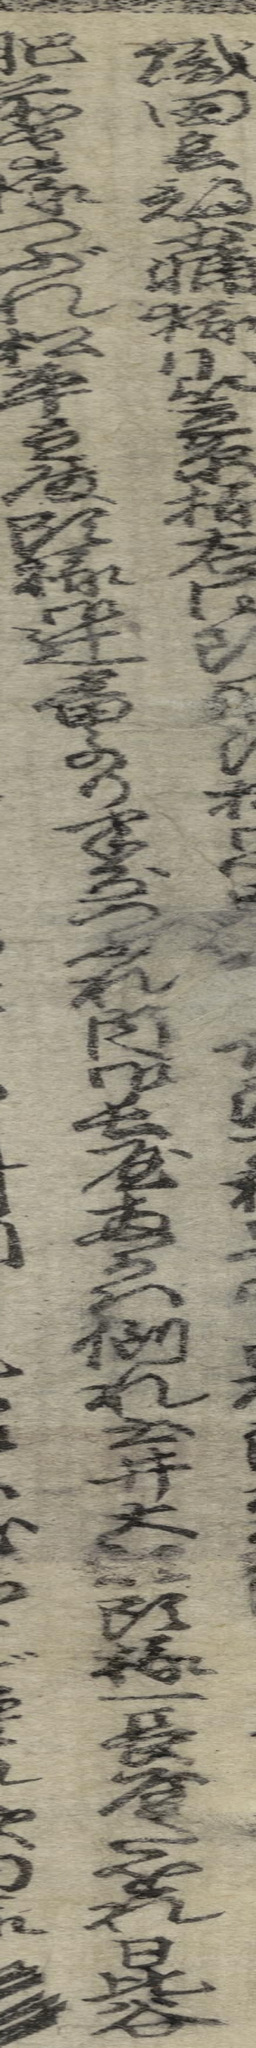肥前守様つぶれ松平主殿頭様御辻番より半分つぶれ内御長屋両かは倒れ土井大炊頭様一長屋たをれ日比谷
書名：江戸十里四方大風出水焼失　場所附
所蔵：東京大学地震研究所図書室 Earthquake Research Institute Library, The University of Tokyo, JAPAN
